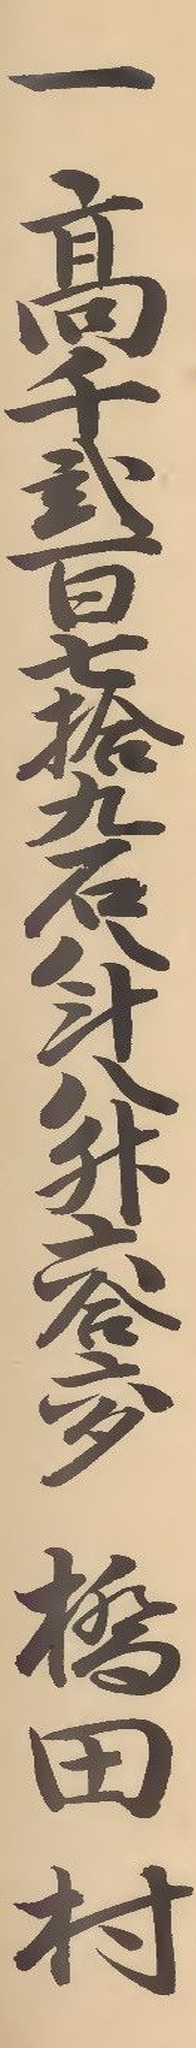一高千弐百七拾九石八斗八升六合六勺橋田村
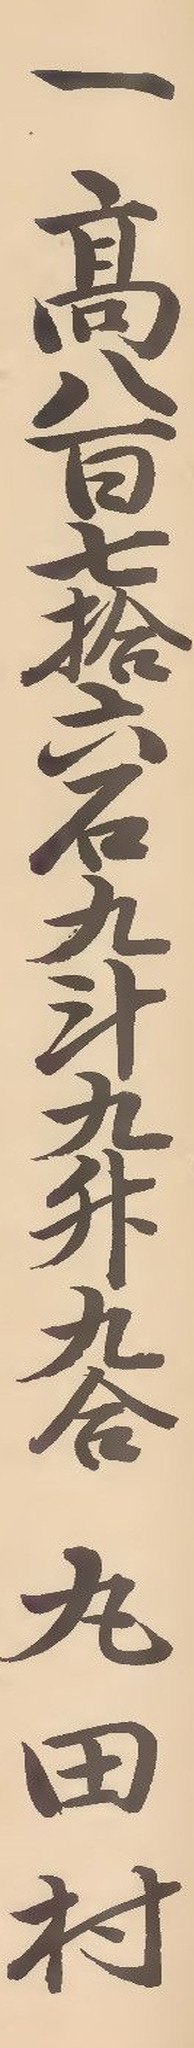一高八百七拾六石九斗九升九合丸田村
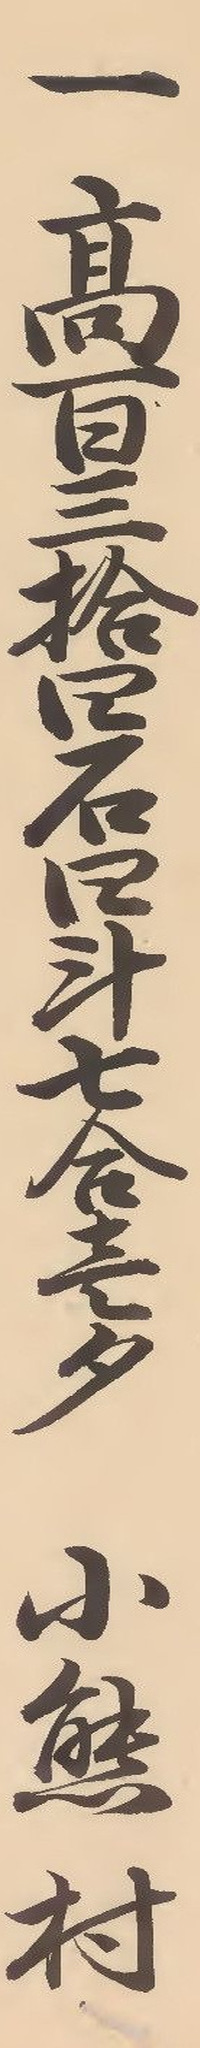一高百三拾四石四斗七合壱勺小熊村
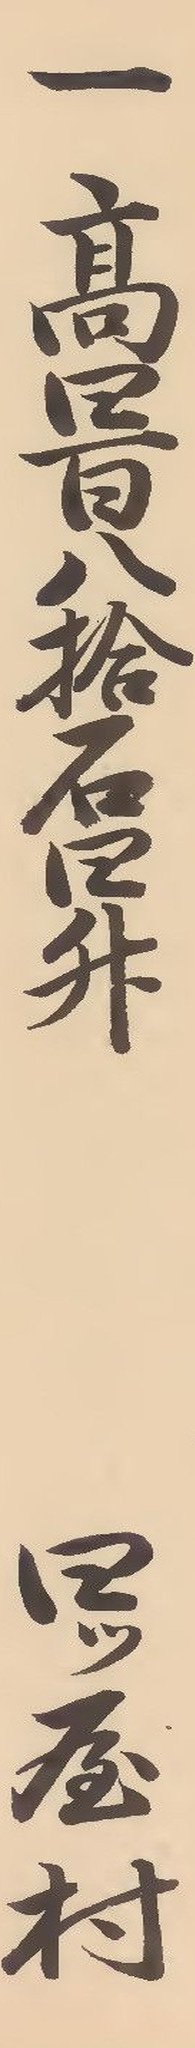一高四百八拾石四升四ッ屋村
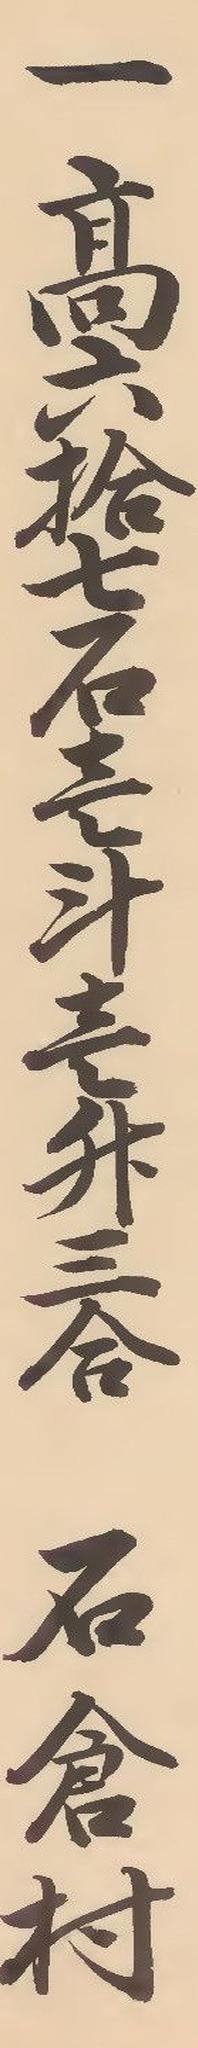一高六拾七石壱斗壱升三合石倉村

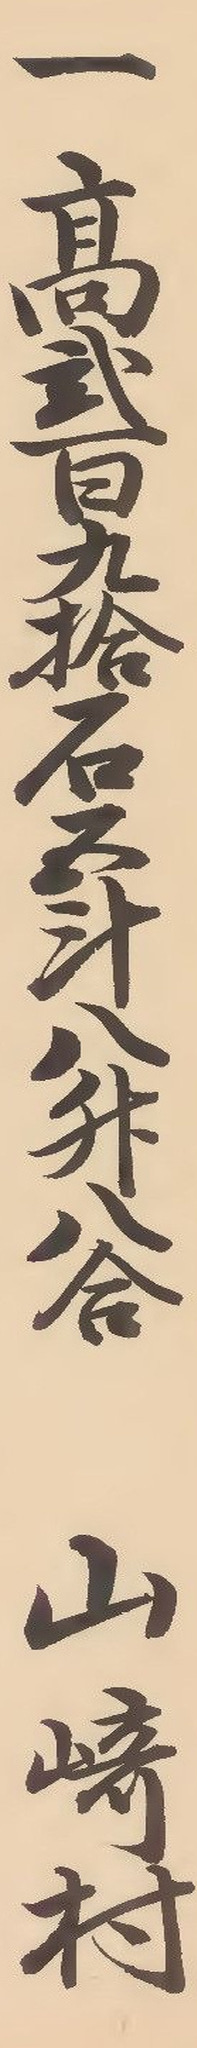一高弐百九拾石五斗八升八合山崎村
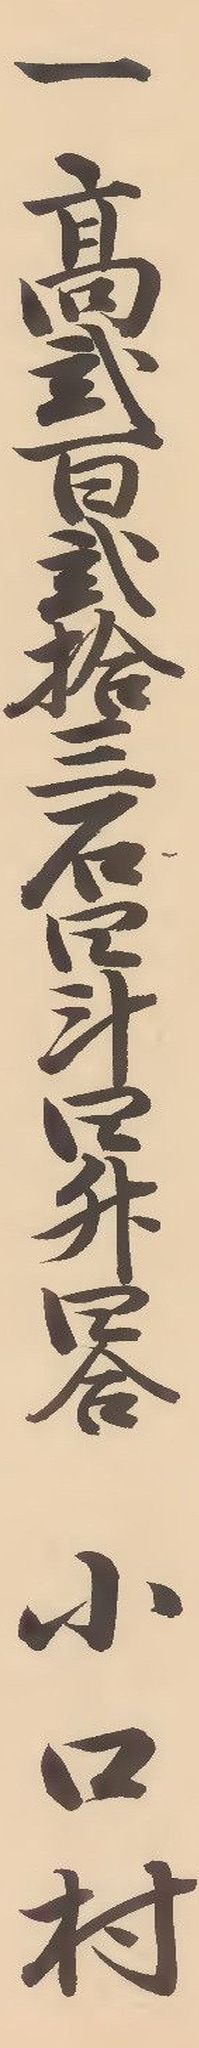一高弐百弐拾三石四斗四升四合小口村
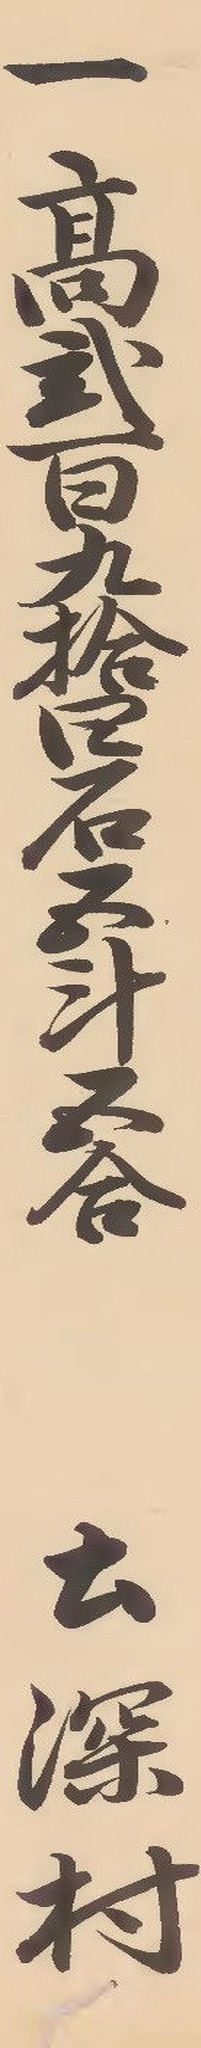一高弐百九拾四石五斗五合土深村
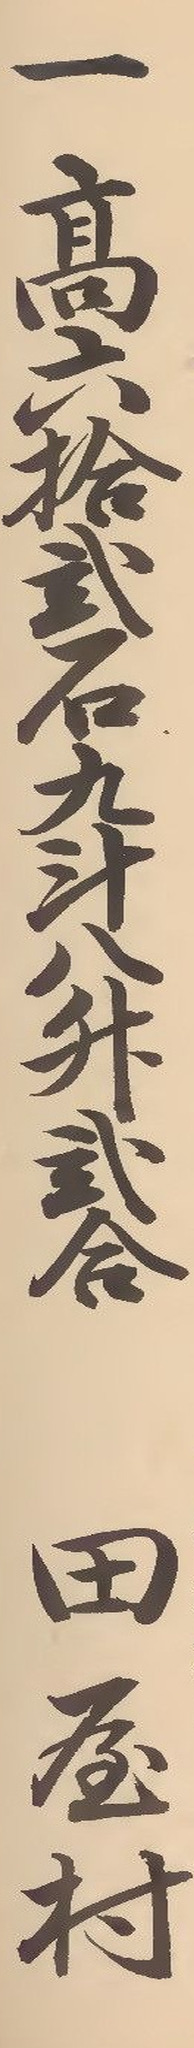一高六拾弐石九斗八升弐合田屋村
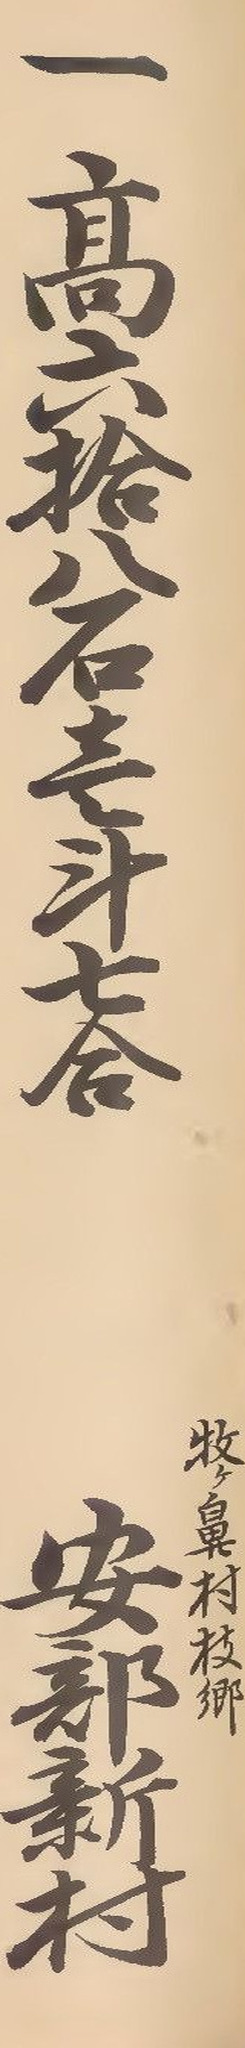一高六拾八石壱斗七合安部新村
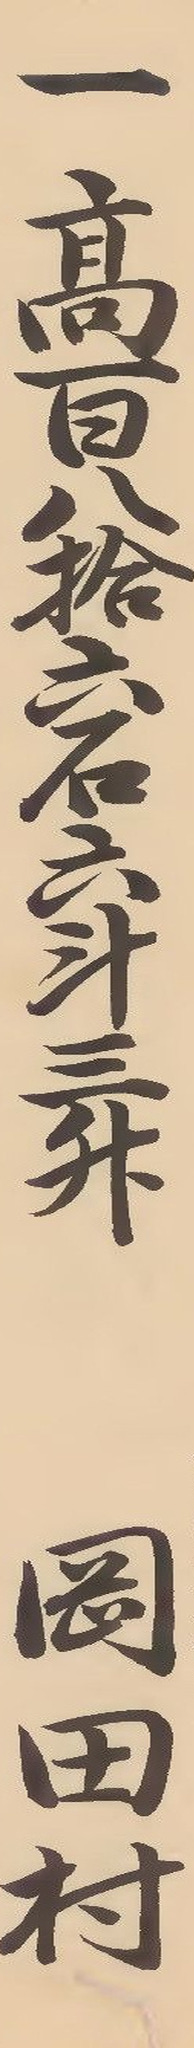一高百八拾六石六斗三升岡田村
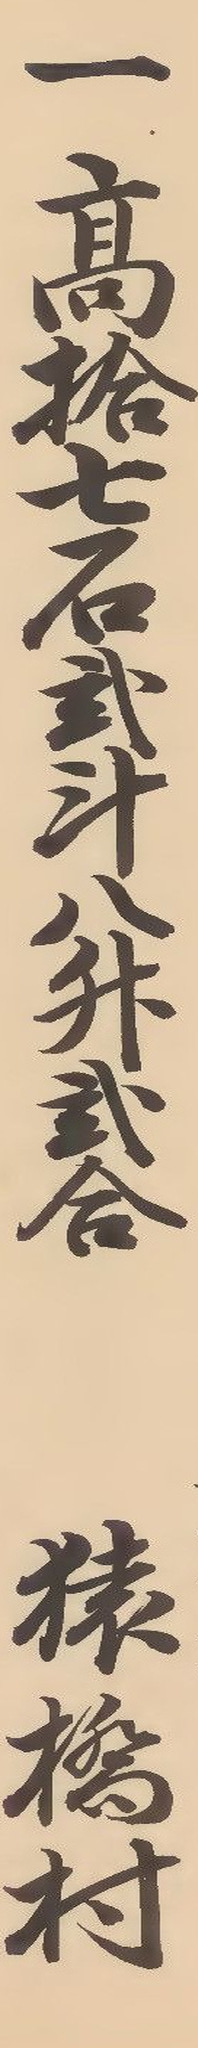一高拾七石弐斗八升弐合猿橋村
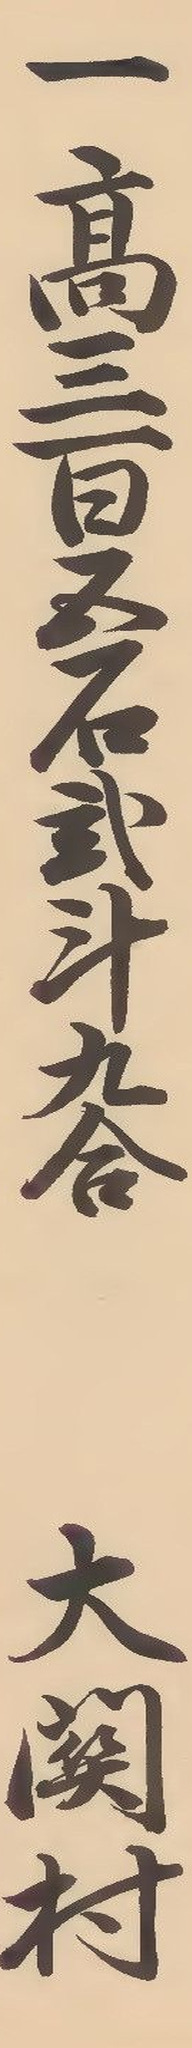一高三百五石弐斗九合大関村

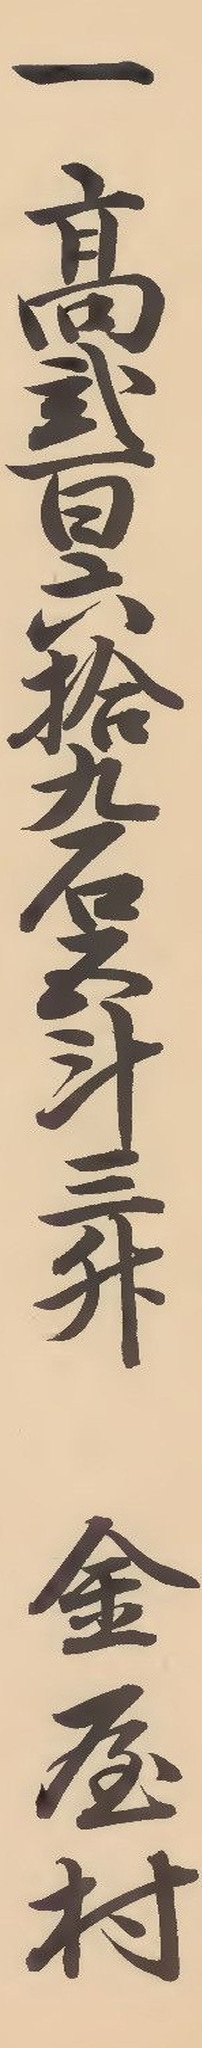一高弐百六拾九石五斗三升金屋村
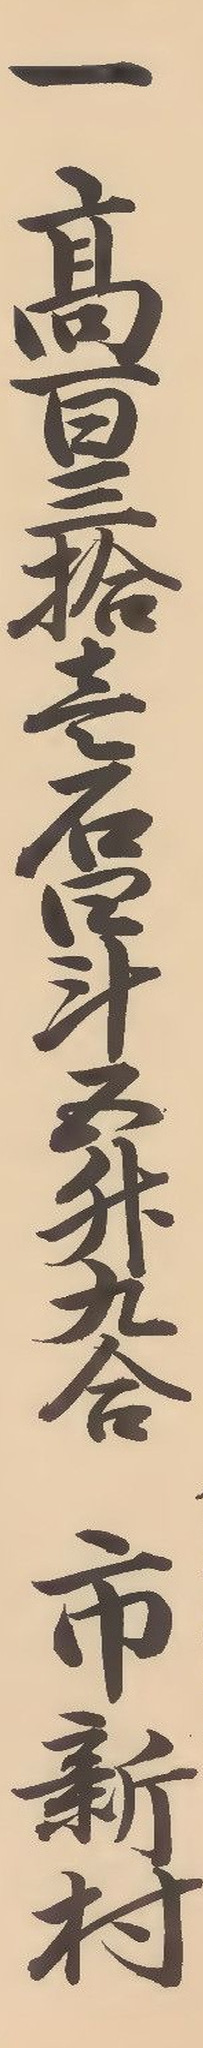一高百三拾壱石四斗五升九合市新村
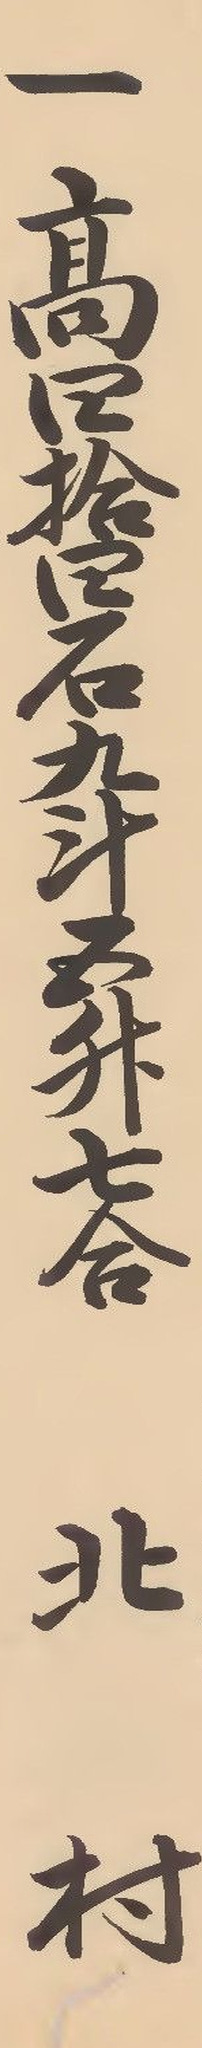一高四拾四石九斗五升七合北村
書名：越後国郷帳　下
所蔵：国立公文書館 National Archives of Japan
